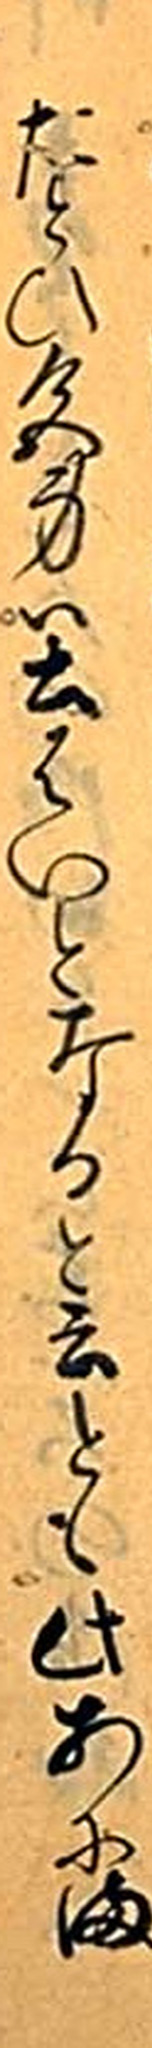たとひ色身は土はいとなると云とも此あにま
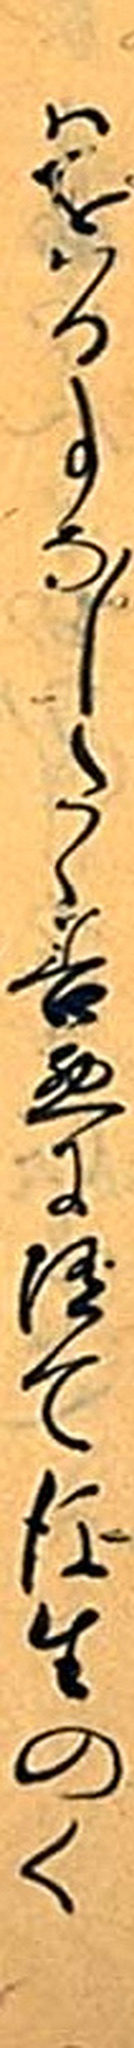はをはる事なしたゝ善悪に随て後生のく
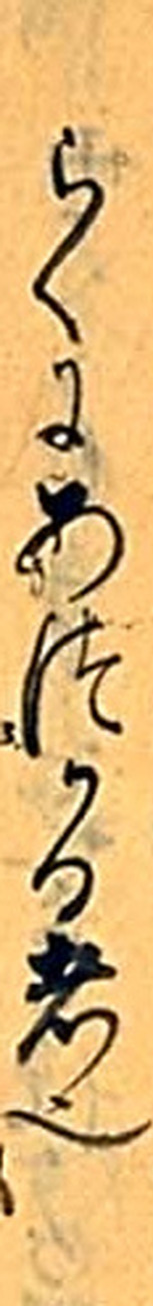らくにあつかる者也
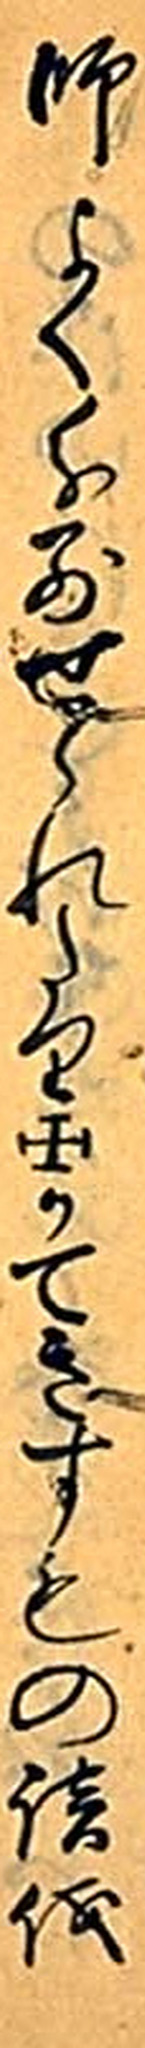師よく分別せられたり☩かてきすもの信儀
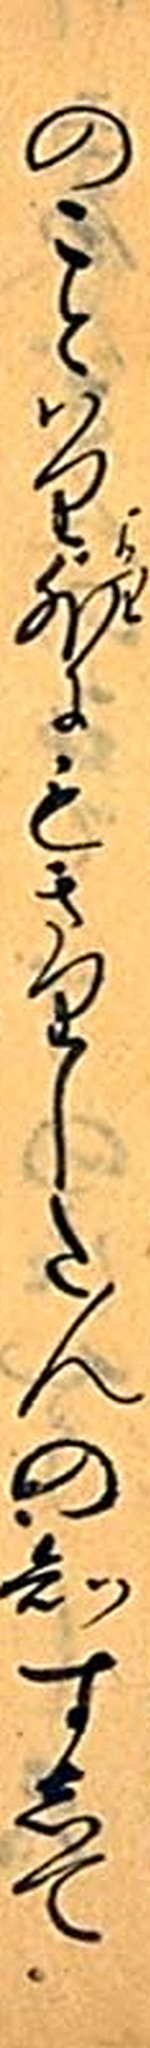のことはりより外にもきりしたんの知すして
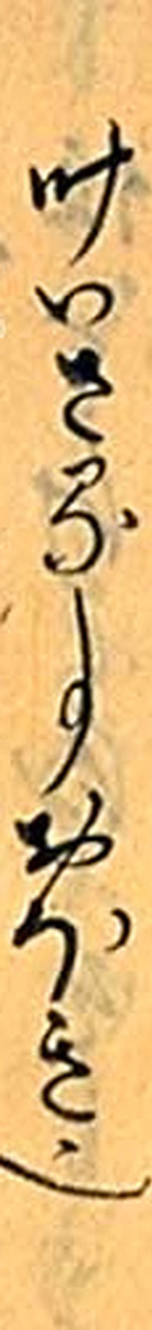叶はさる事おほき也
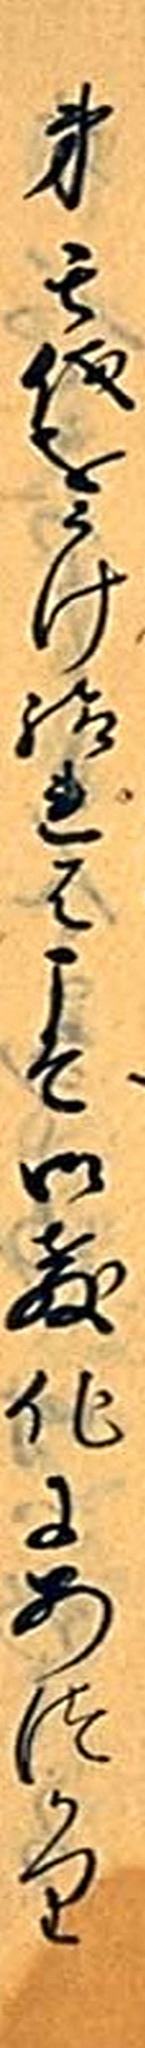弟其儀をうけ給れはこそ御教化にあつかり
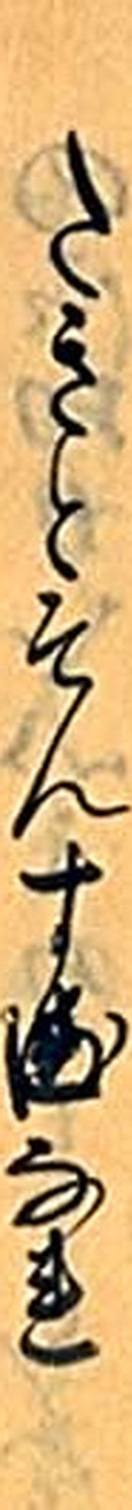たきとそんするなれ
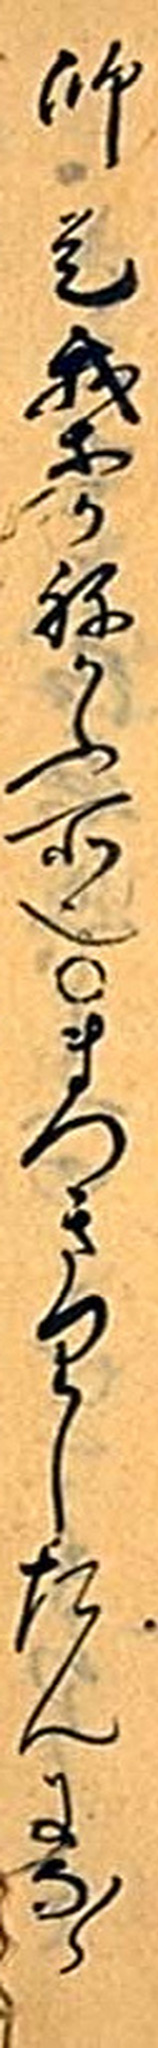師是我等かねかう所也○まつきりしたんになら
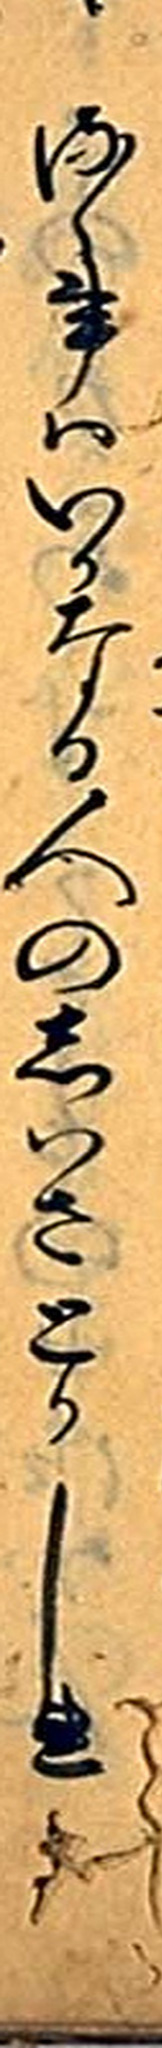るゝ事はいかなる人のしはさとかしれ
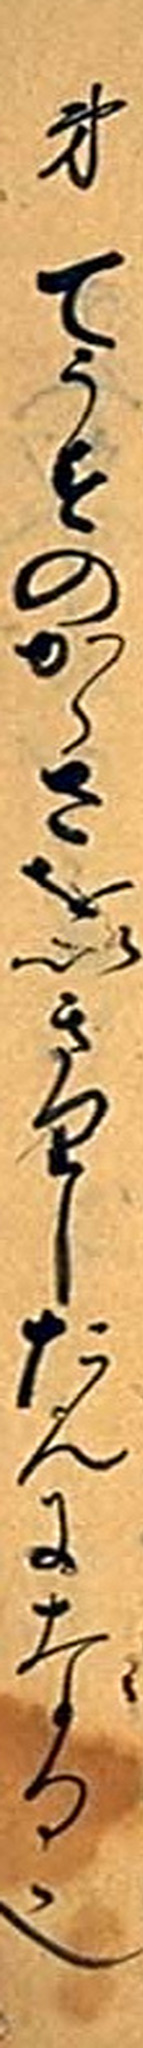弟てうすのからさを以きりしたんになる也
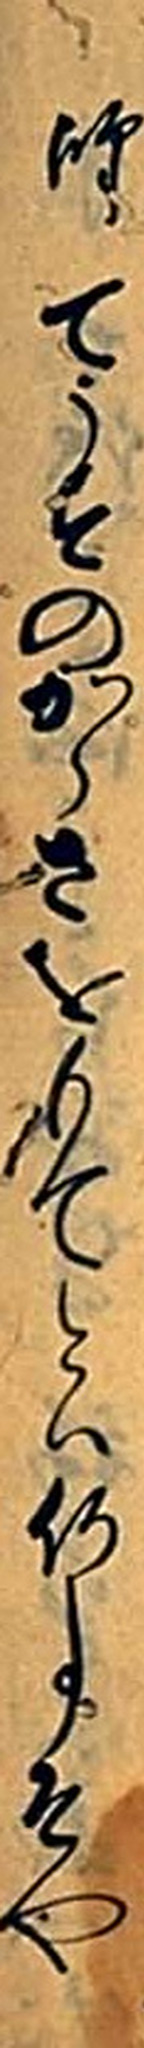師てうすのからさをもてとは何事そや

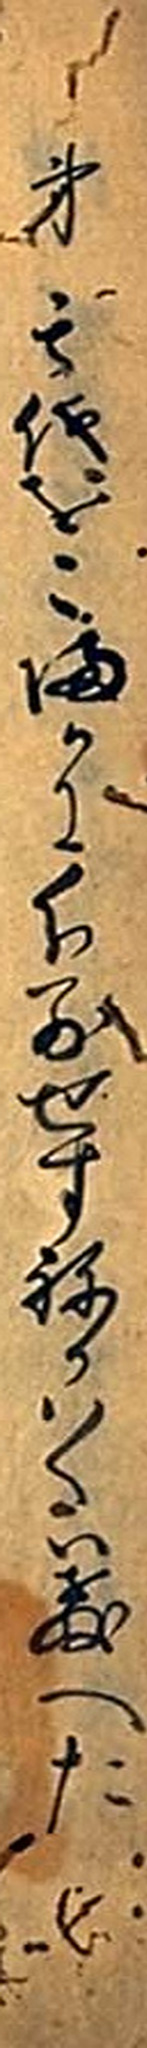弟其儀をこまかに分別せすねかはくは教へた
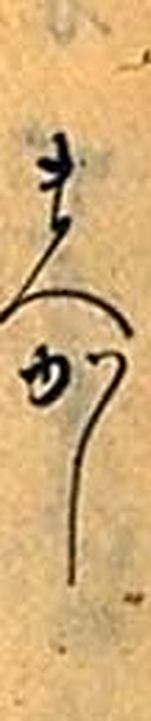まへかし
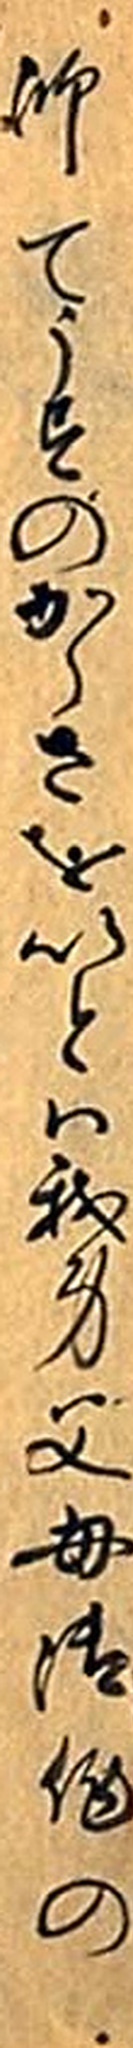師てうすのからさを以とは我身父母御作の
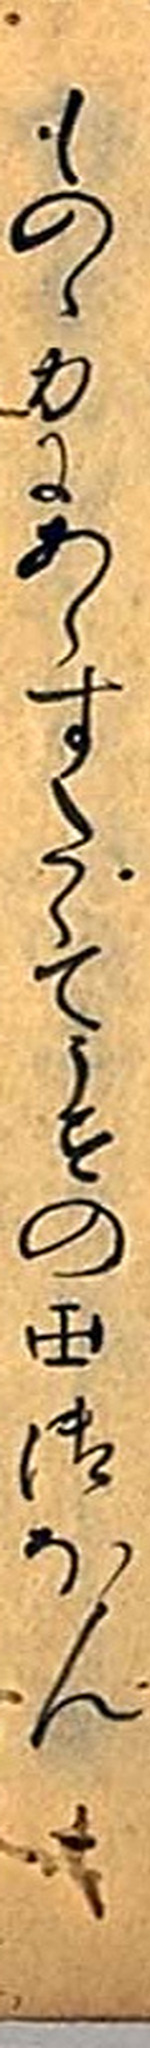ものゝ力にあらすたゝてうすの☩御ほん
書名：ドチリナ・キリシタン
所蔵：東京大学総合図書館 / General Library in the University of Tokyo
